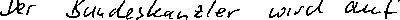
Der Bundeskanzler wird auf
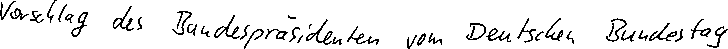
Vorschlag des Bundespräsidenten vom Deutschen Bundestag
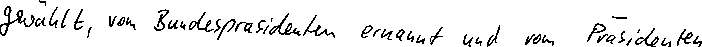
gewählt, vom Bundespräsidenten ernannt und vom Präsidenten
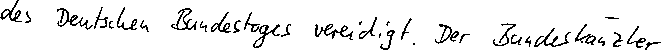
des Deutschen Bundestages vereidigt. Der Bundeskanzler
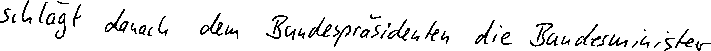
Schlägt danach dem Bundespräsidenten die Bundesminister
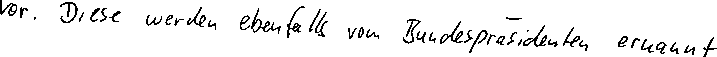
vor. Diese werden ebenfalls vom Bundespräsidenten ernannt
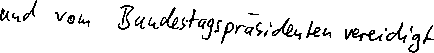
und vom Bundestagspräsidenten vereidigt.
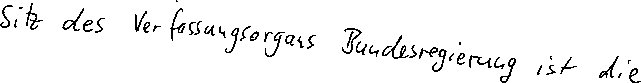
Sitz des Verfassungsorgans Bundesregierung ist die
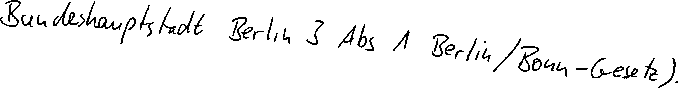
Bundeshauptstadt Berlin 3 Abs. 1 Berlin/Bonn-Gesetz).
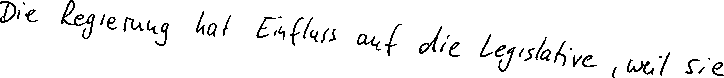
Die Regierung hat Einfluss auf die Legislative, weil sie
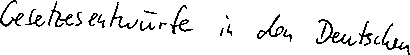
Gesetzesentwürfe in den Deutschen
